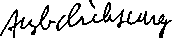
Ausbelichtung
